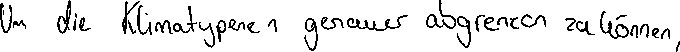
Um die Klimatypen genauer abgrenzen zu können,
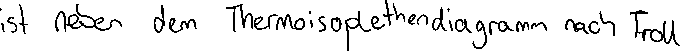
ist neben dem Thermoisoplethendiagramm nach Troll
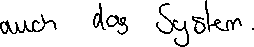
auch das System
